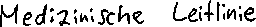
Medizinische Leitlinie
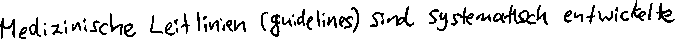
Medizinische Leitlinien (guidelines) sind systematisch entwickelte
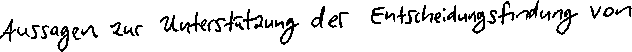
Aussagen zur Unterstützung der Entscheidungsfindung von
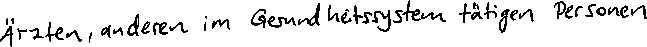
Ärzten, anderen im Gesundheitssystem tätigen Personen
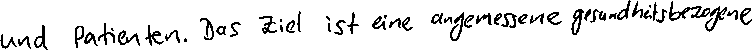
und Patienten. Das Ziel ist eine angemessene gesundheitsbezogene
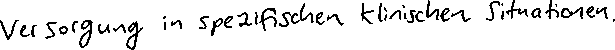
Versorgung in spezifischen klinischen Situationen.
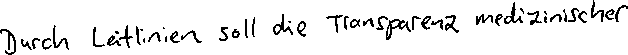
Durch Leitlinien soll die Transparenz medizinischer
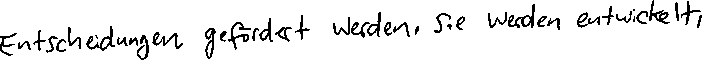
Entscheidungen gefördert werden. Sie werden entwickelt,
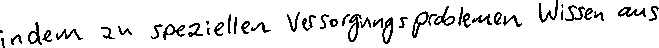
indem zu speziellen Versorgungsproblemen Wissen aus
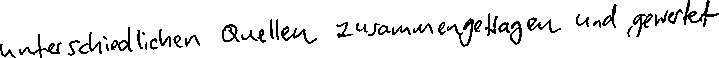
unterschiedlichen Quellen zusammengetragen und gewertet
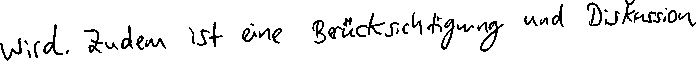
wird. Zudem ist eine Berücksichtigung und Diskussion
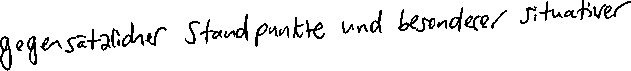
gegensätzlicher Standpunkte und besonderer situativer
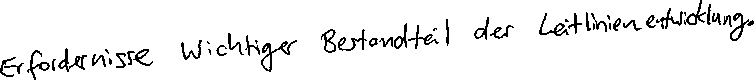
Erfordernisse wichtiger Bestandteil der Leitlinienentwicklung.
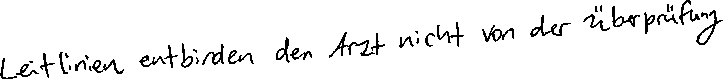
Leitlinien entbinden den Arzt nicht von der Überprüfung
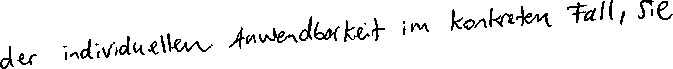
er individuellen Anwendbarkeit im konkreten Fall, sie
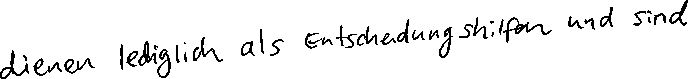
dienen lediglich als Entscheidungshilfen und sind
